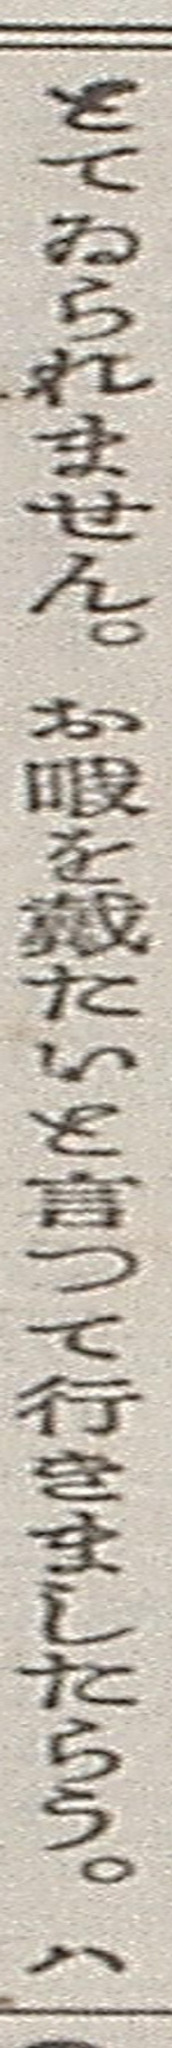とてゐられません。お暇を戴たいと言つて行きましたらう。ハ
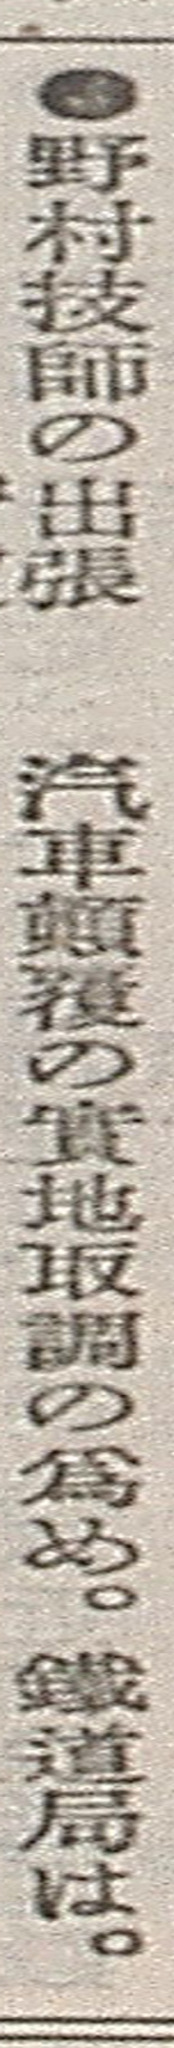●野村技師の出張汽車顚覆の実地取調の為め。鉄道局は。
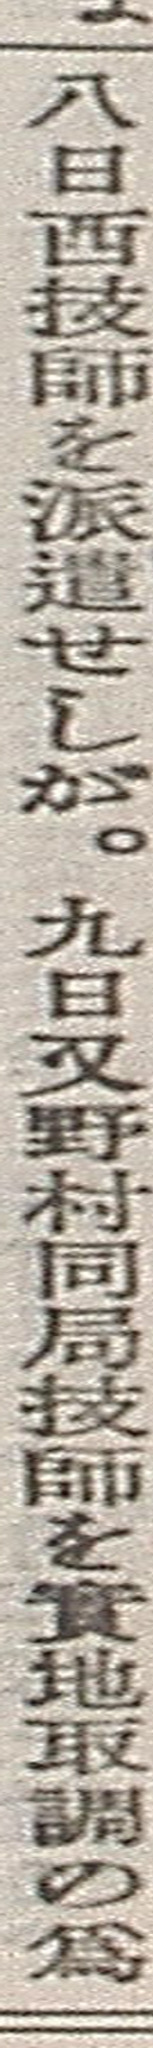八日西技師を派遣せしが。九日又野村同局技師を実地取調の為
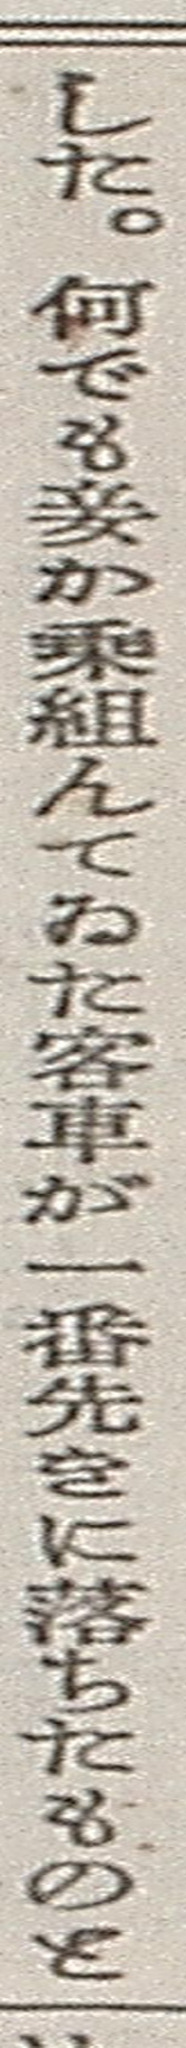した。何でも妾か乗組んてゐた客車が一番先きに落ちたものと
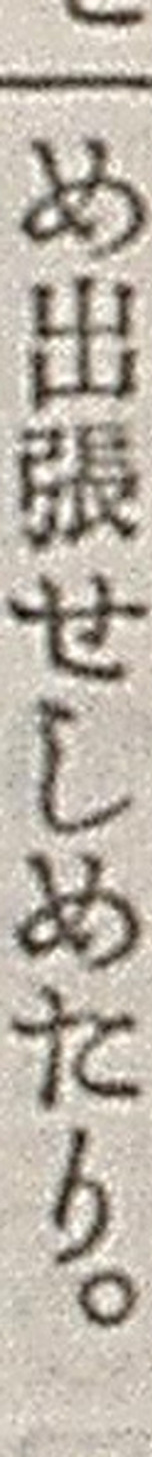め出張せしめたり。
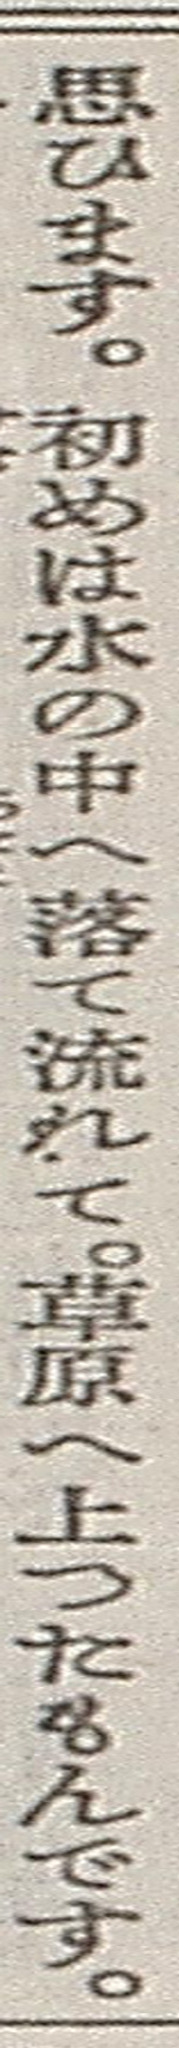思ひます。初めは水の中へ落て流れて。草原へ上つたもんです。
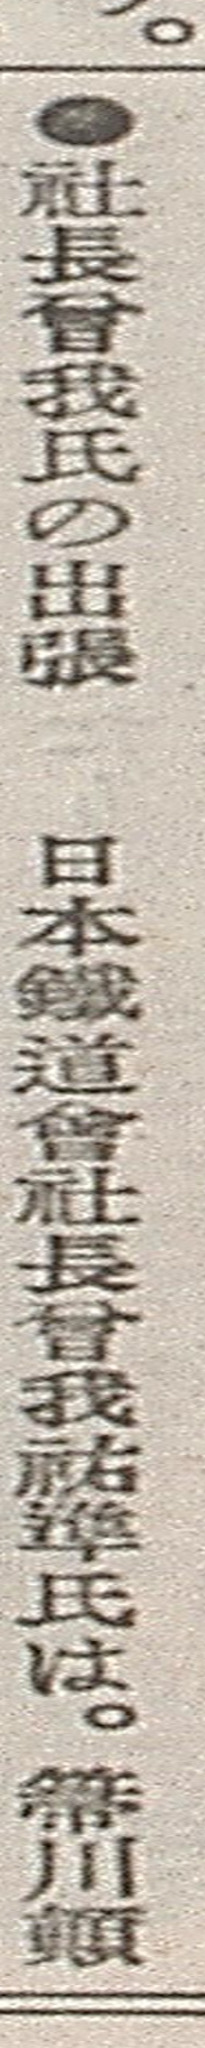●社長曽我氏の出張日本鉄道会社長曽我祐準氏は。箒川顚
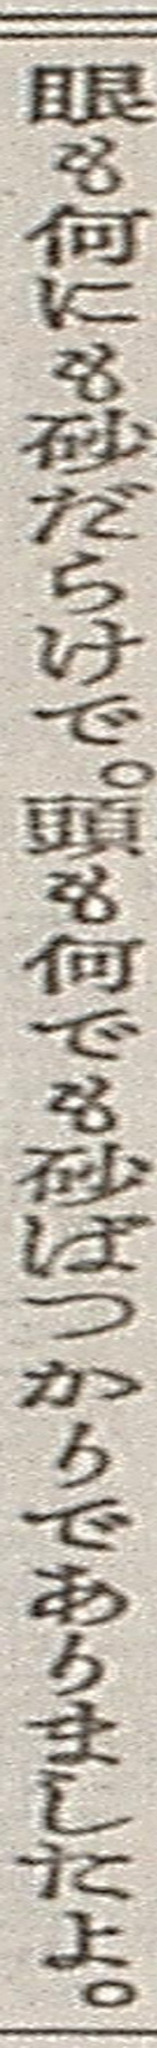眼も何にも砂だらけで。頭も何でも砂ばつかりでありましたよ。
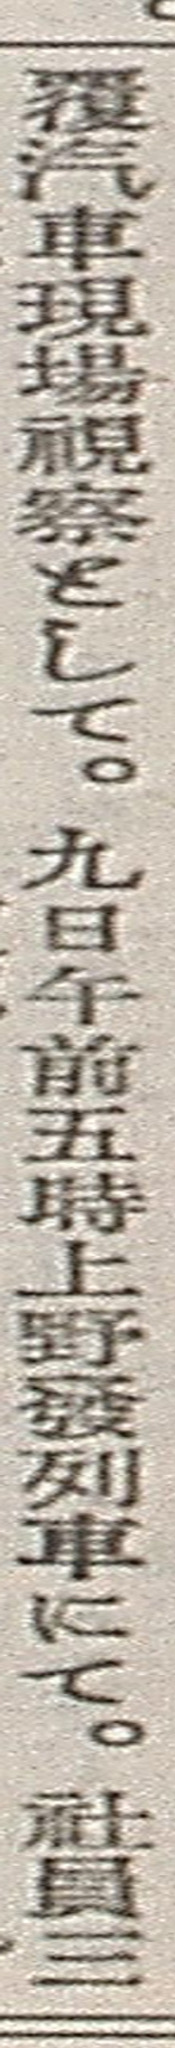覆汽車現場視察として。九日午前五時上野発列車にて。社員三
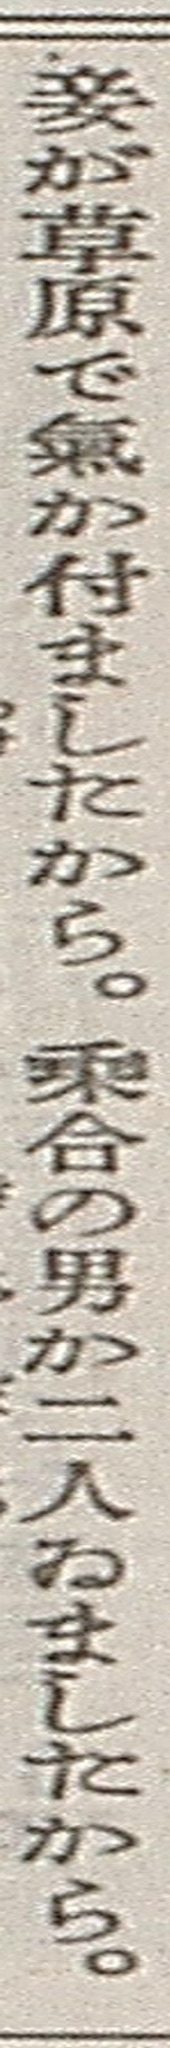妾が草原で気か付ましたから。乗合の男か二人ゐましたから。
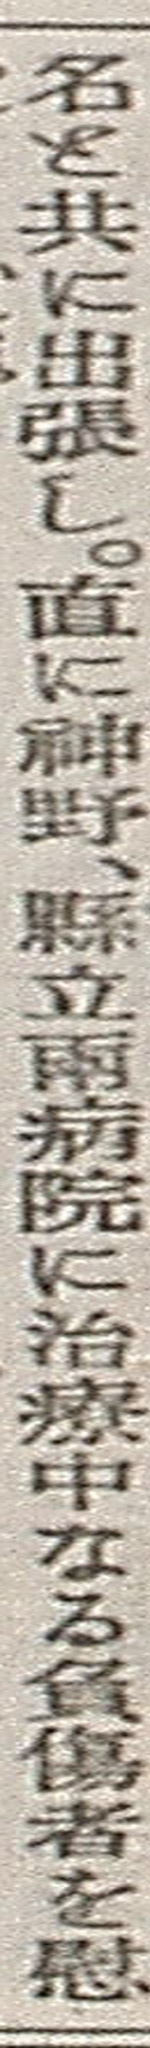名と共に出張し。直に神野、県立南病院に治療中なる負傷者を慰
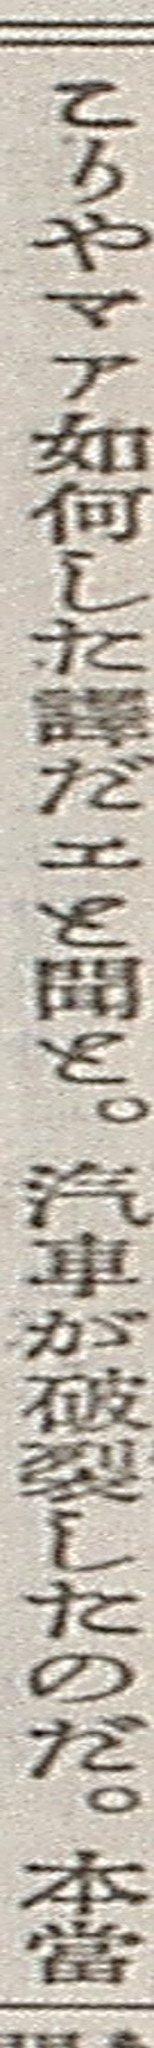こりやマア如何した訳だエと聞と。汽車が破裂したのだ。本当
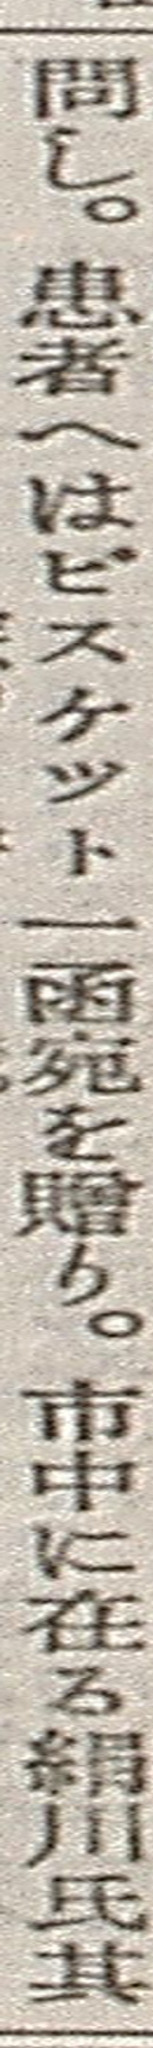問し。患者へはビスケツト一函宛を贈り。市中に在る絹川氏其
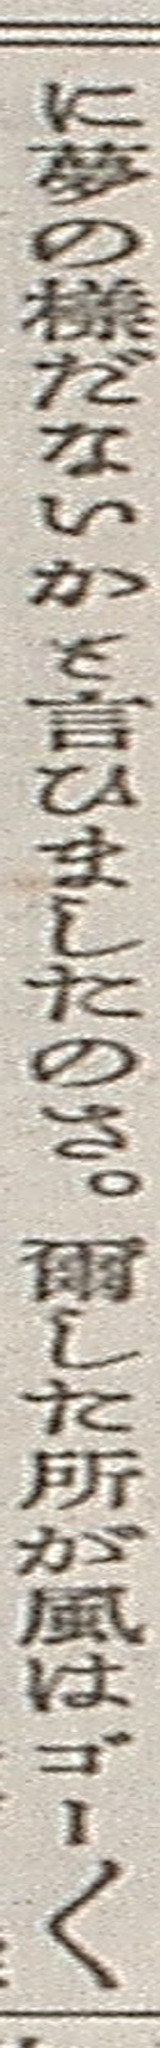に夢の様だないかと言ひましたのさ。爾した所が風はゴー〳〵
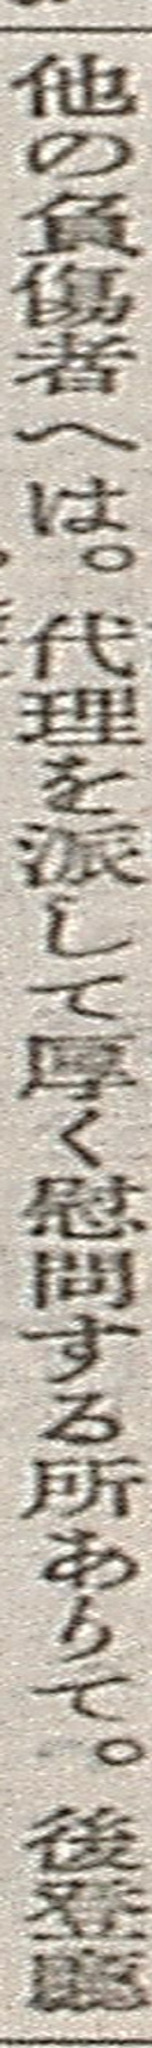他の負傷者へは。代理を派して厚く慰問する所ありて。後登庁
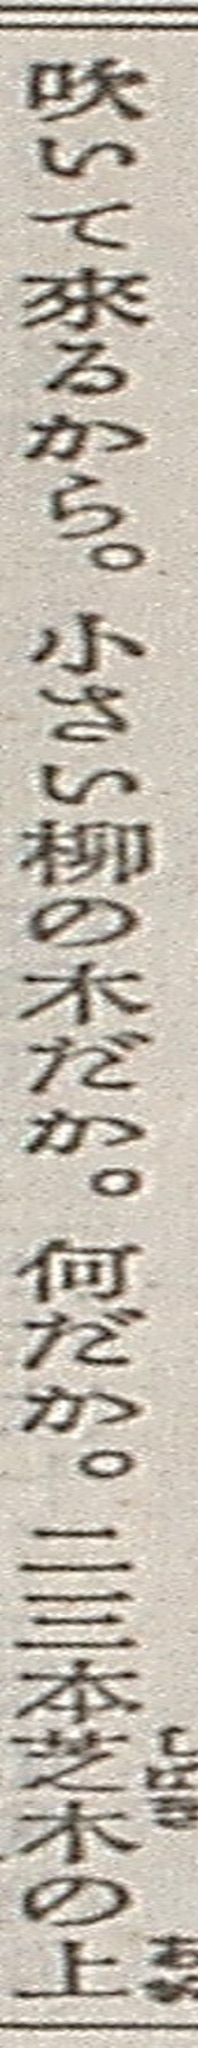吹いて来るから。小さい柳の木だか。何だか。二三本芝木の上
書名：風俗畫報臨時増刊第百九十九號　明治三十二年十月各地災害圖會（前編之續）
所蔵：東京大学地震研究所図書室 Earthquake Research Institute Library, The University of Tokyo, JAPAN
